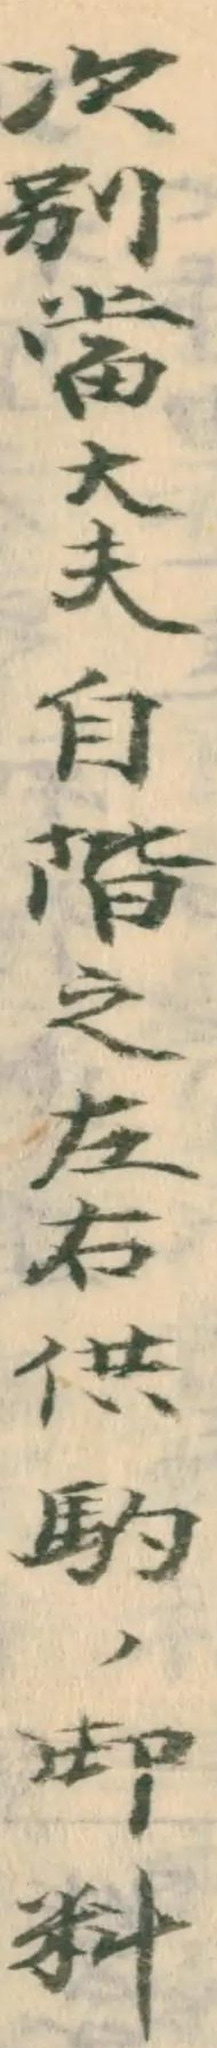次別当大夫自階之左右供駒ノ御料
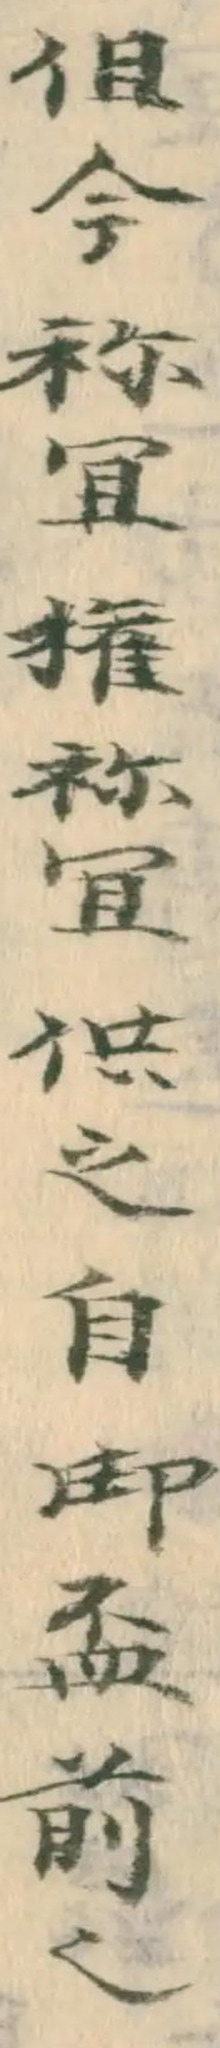但今禰宜権禰宜供之自御盃前也
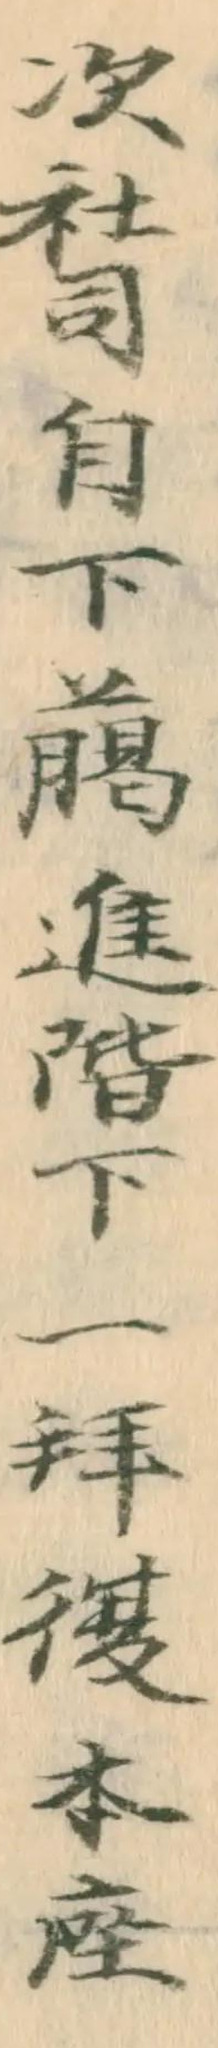次社司自下臈進階下一拝復本座
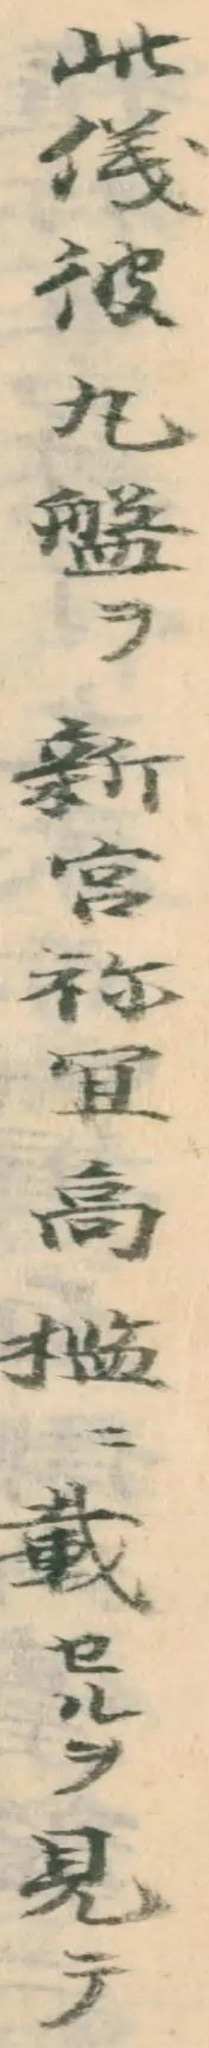此儀彼九盤ヲ新宮禰宜高檻ニ載セルヲ見テ
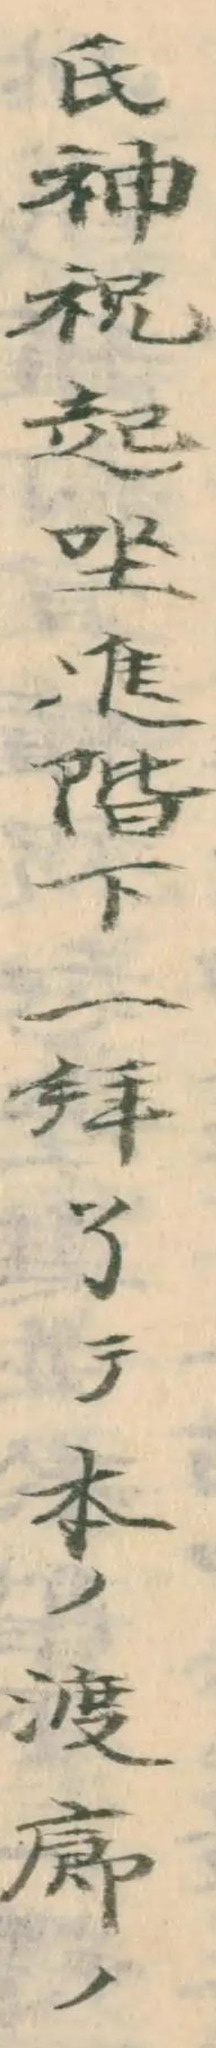氏神祝起坐進階下一拝了テ本ノ渡廊ノ
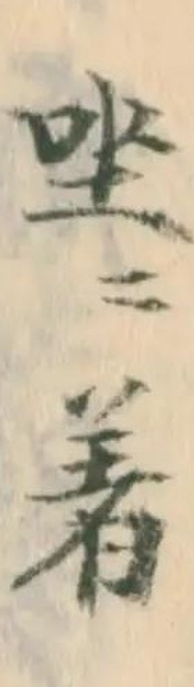坐ニ着
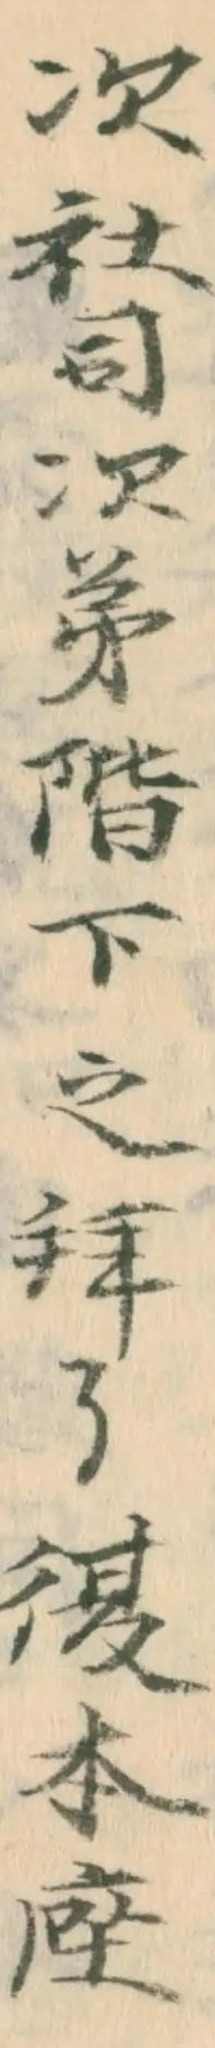次社司次第階下之拝了復本座
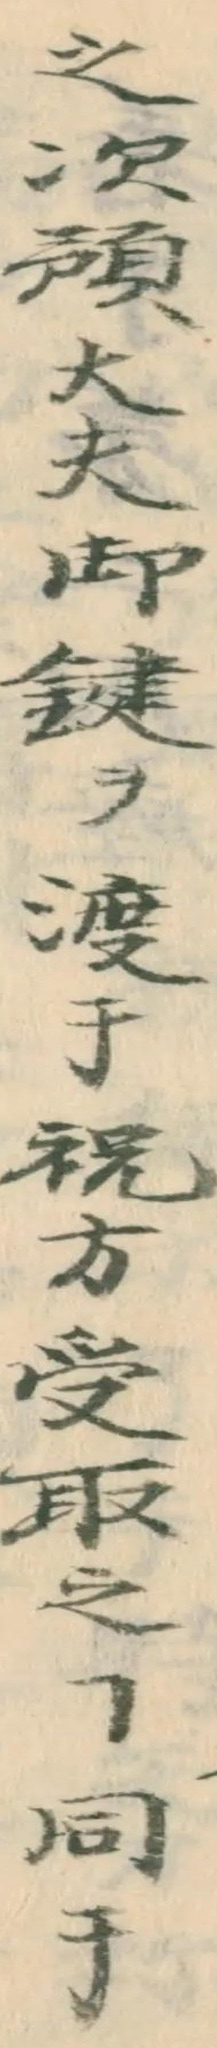之次預大夫御鍵ヲ渡于祝方受取之コト同于
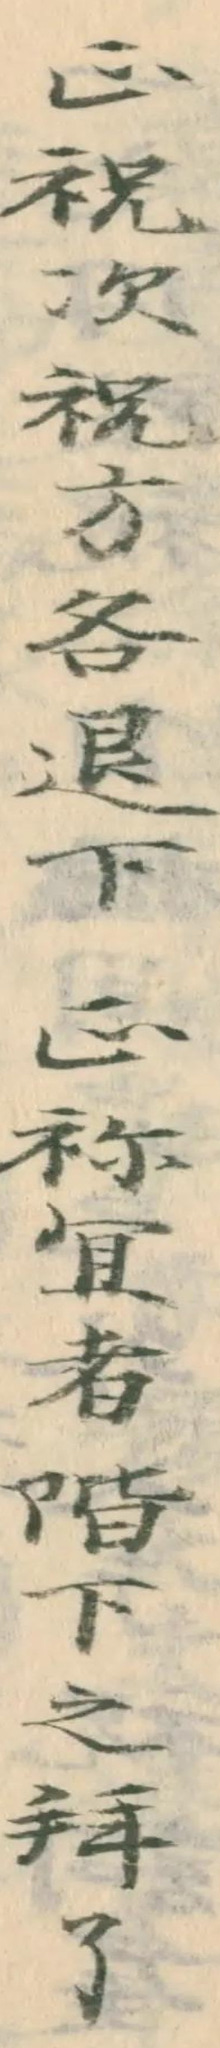正祝次祝方各退下正禰宜者階下之拜了

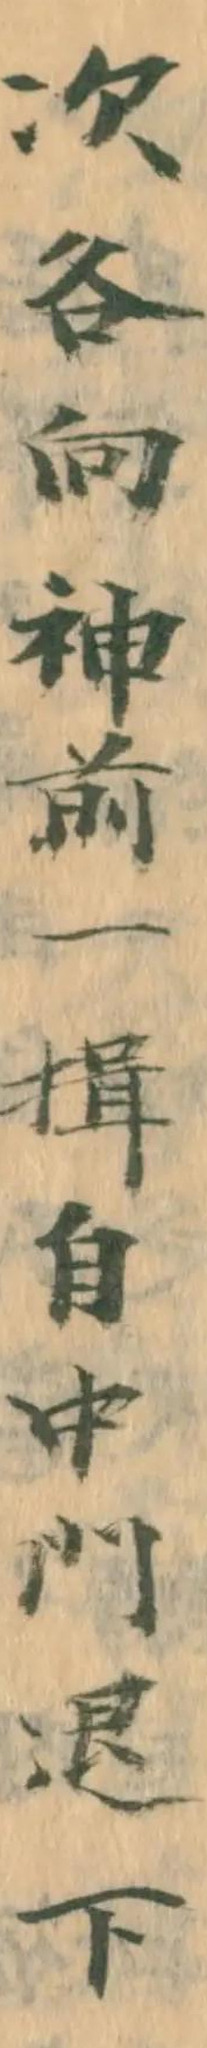次各向神前一揖自中門退下
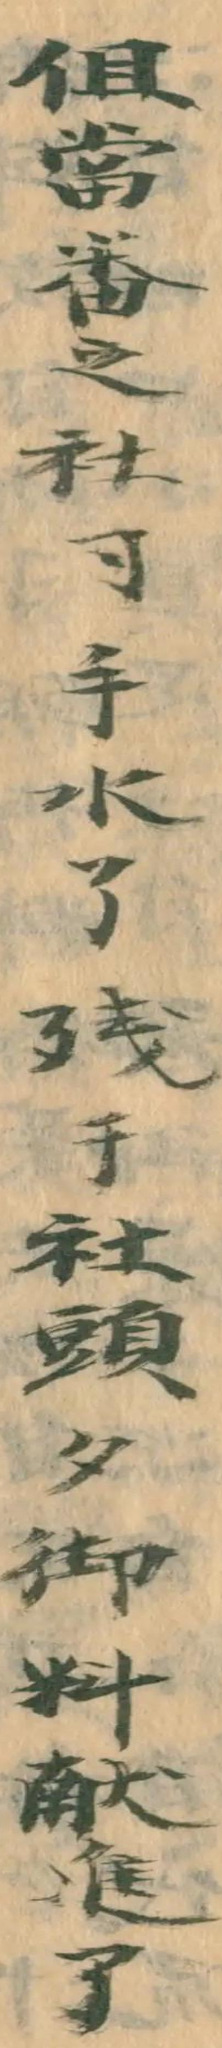但当番之社司手水了残于社頭夕御料献進了
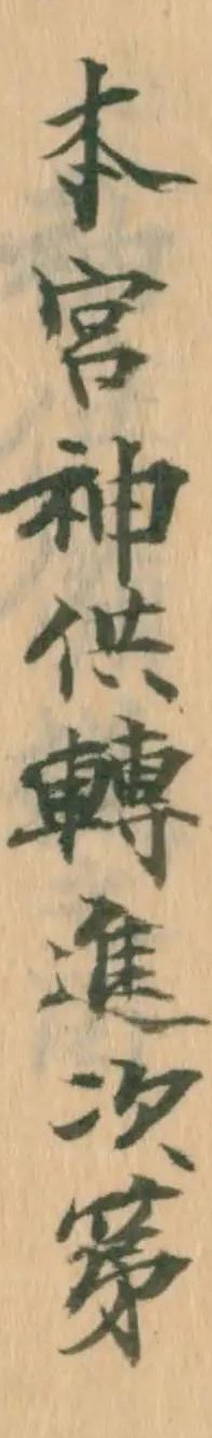本宮神供転進次第

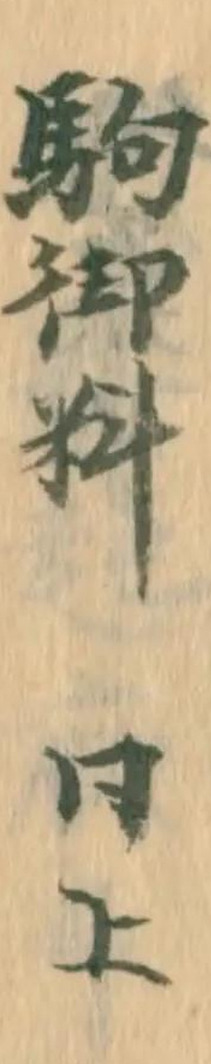駒御料同上
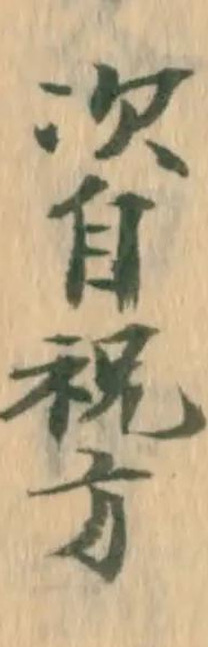次自祝方
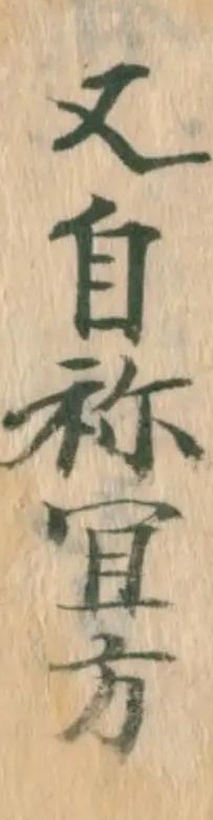又自禰宜方
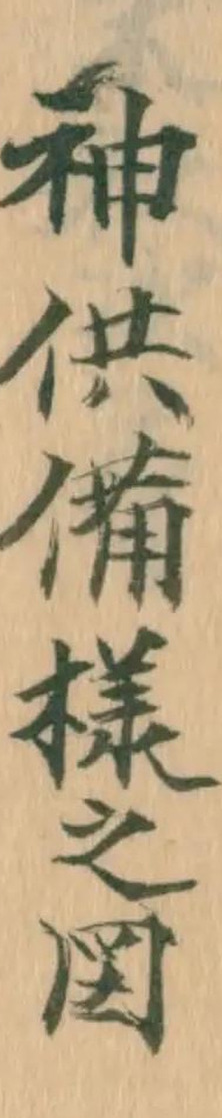神供備様之図
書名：賀茂社記録. 第5冊
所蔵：国立国会図書館 National Diet Library, JAPAN
